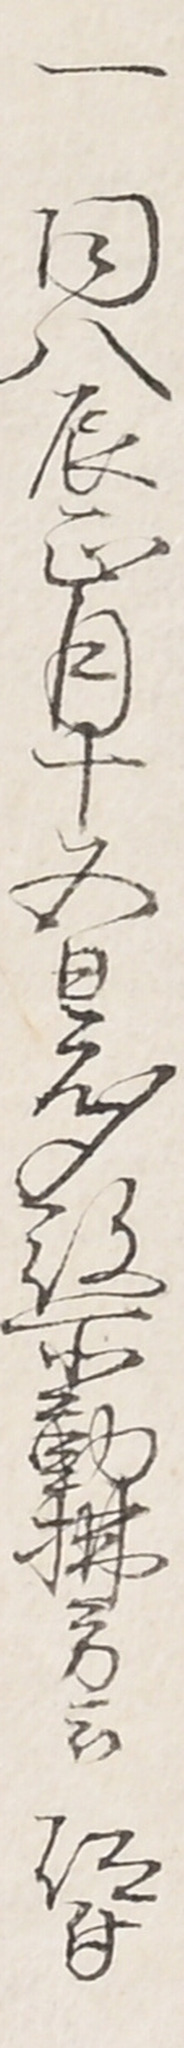一同八辰正月十五日元〆役所勤払方被仰付
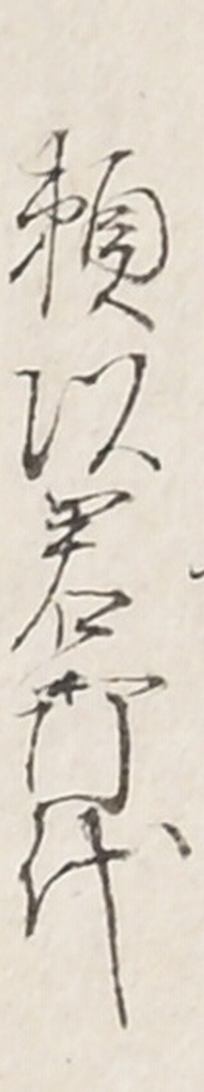頼以君御代
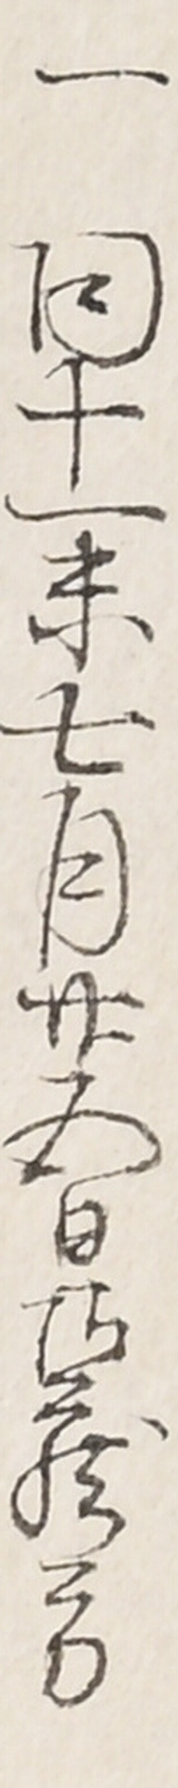一同十一未七月廿五日御蔵方
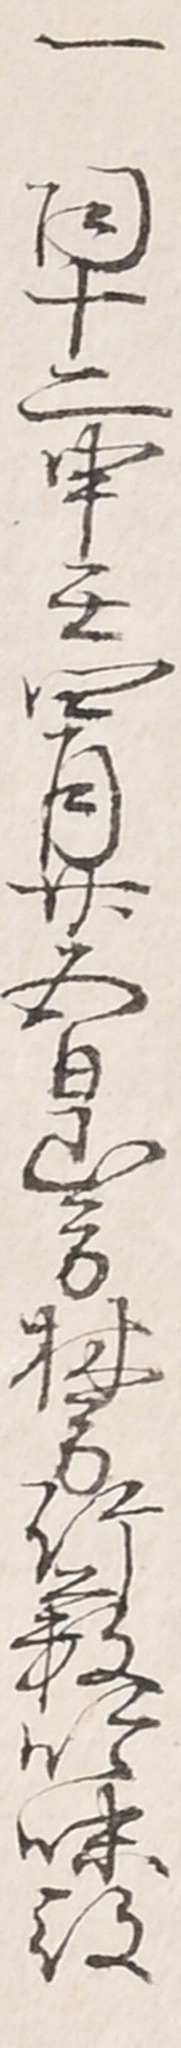一同十二申閏四月廿五日山方林方竹藪吟味役
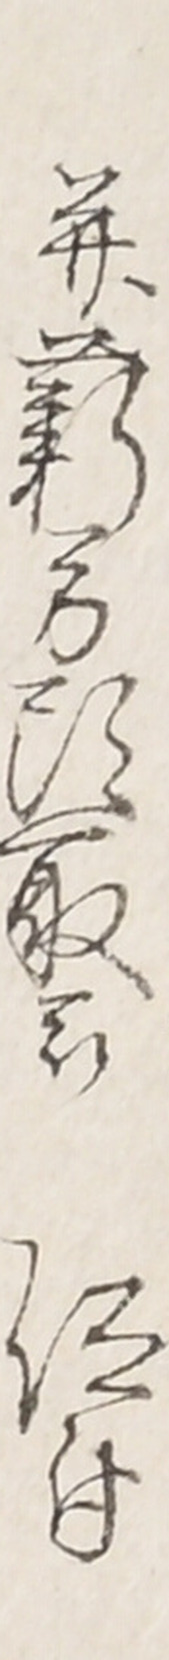并薪方頭取被仰付
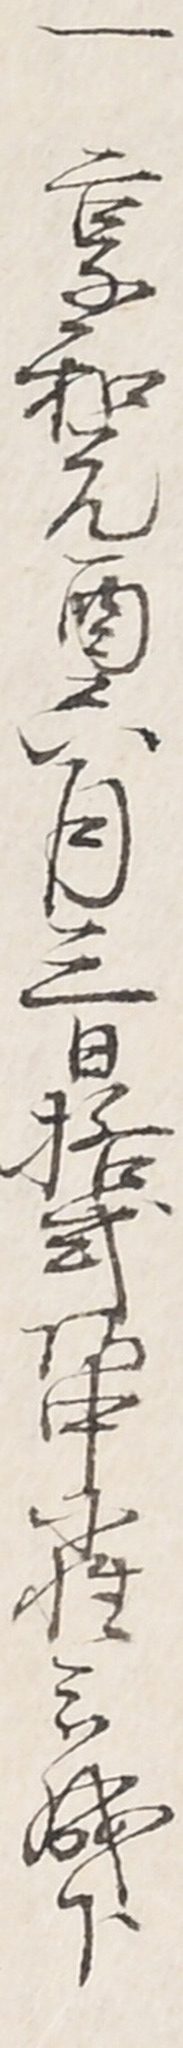一享和元酉六月三日格式御中小性被成下
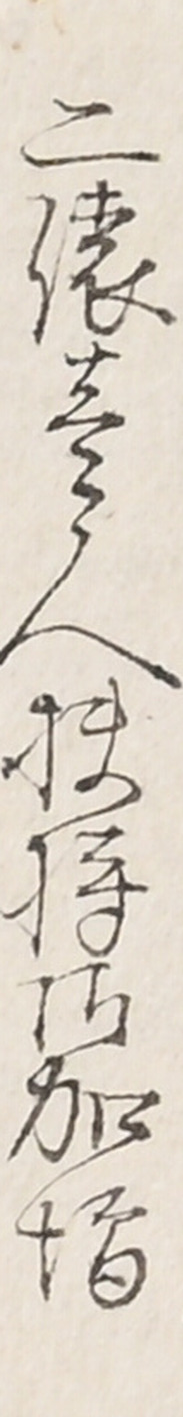二俵壱人扶持御加増
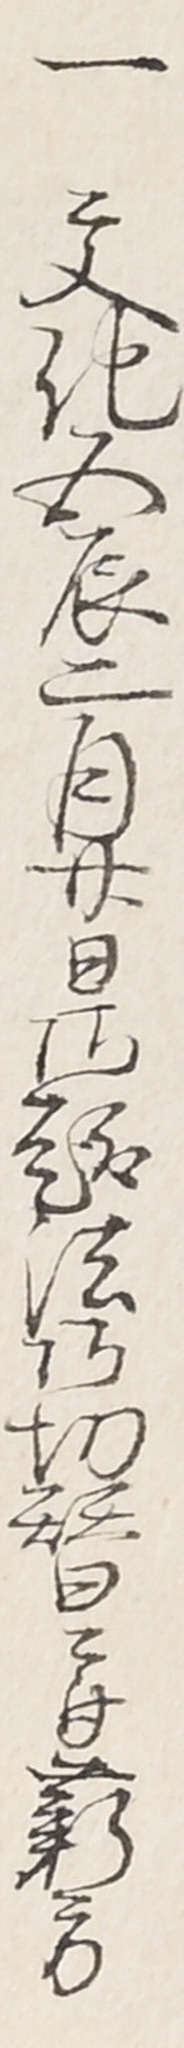一文化五辰二月廿日御趣法御切替二付薪方
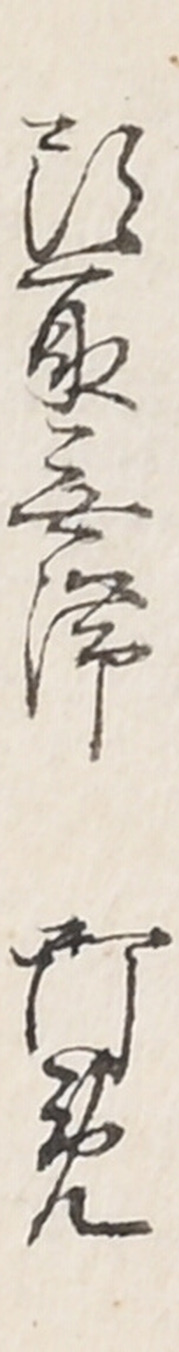頭取無滞御免
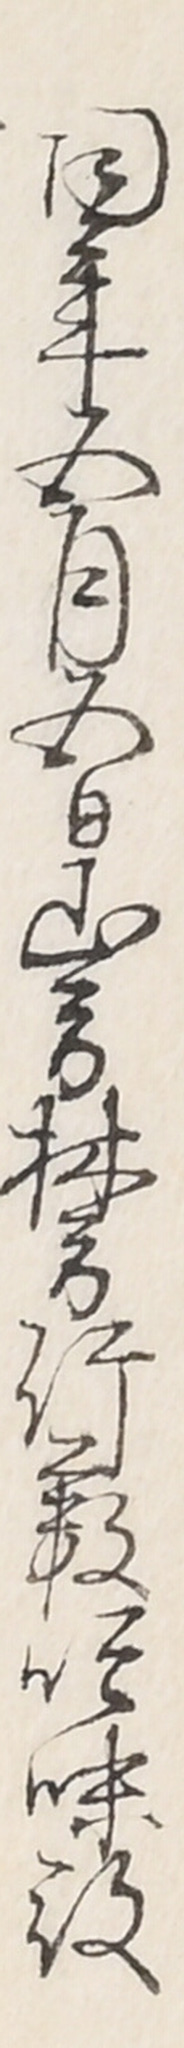一同年五月五日山方林方竹藪吟味役
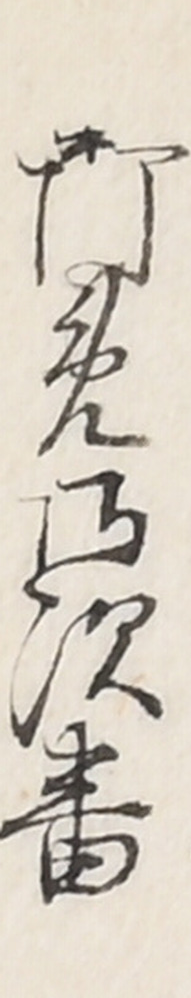御免御次番
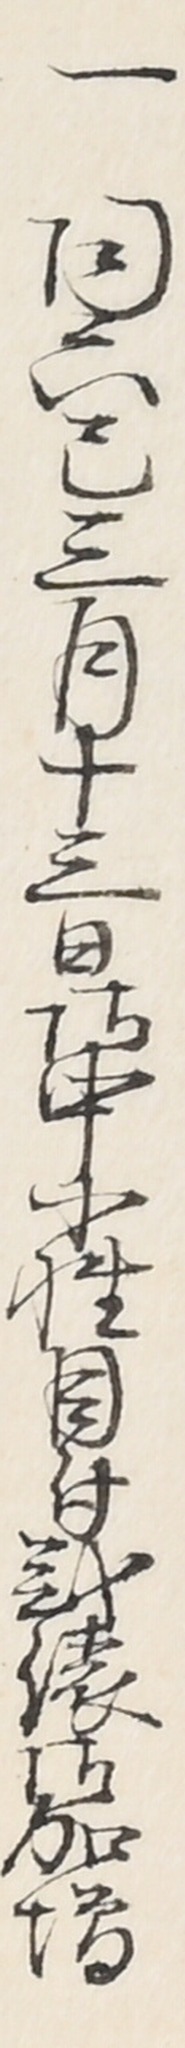一同六巳三月十三日御中小性目付弐俵御加増
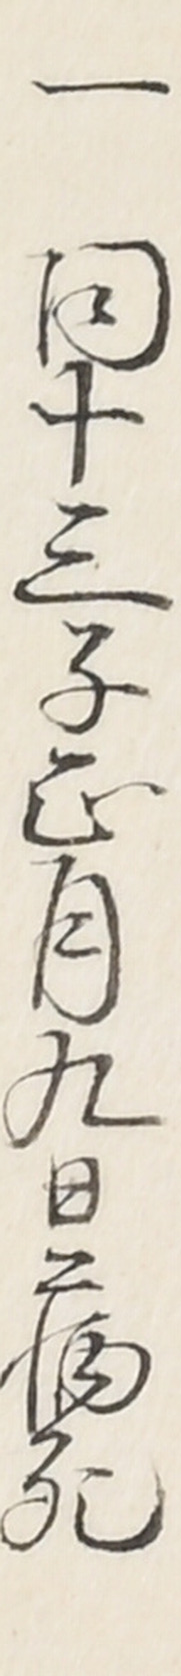一同十三子正月九日病死
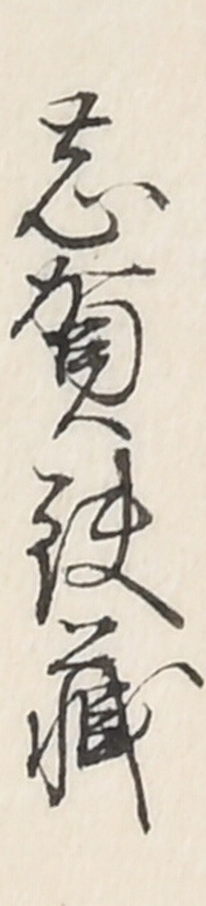志賀鉄蔵
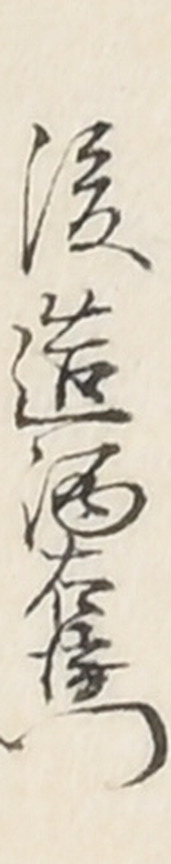後造酒右衛門
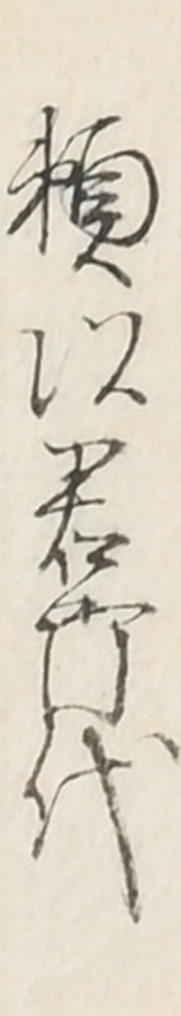頼以君御代
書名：無足諸士勤仕録（四）
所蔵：伊那市立高遠町図書館・合同会社AMANE
